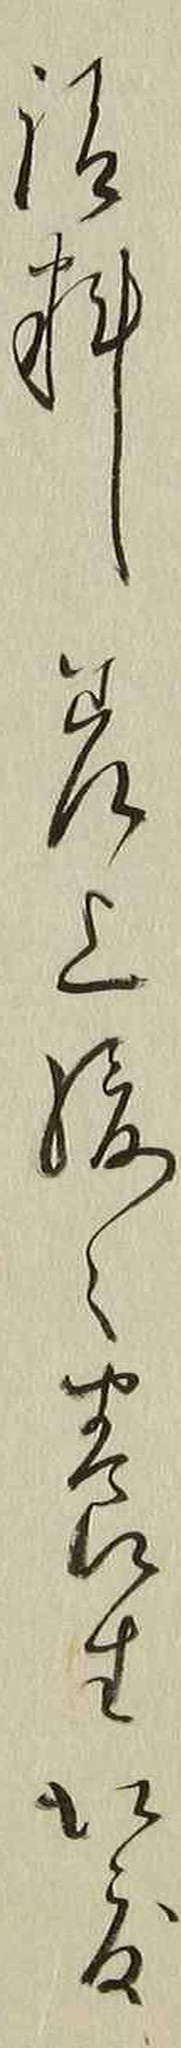請料差上後々養生仕度
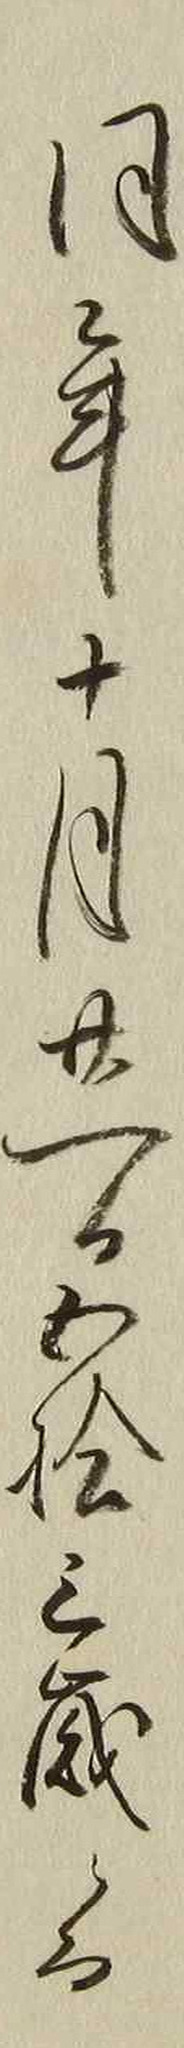一同年十月廿一日五拾三歳ニ而
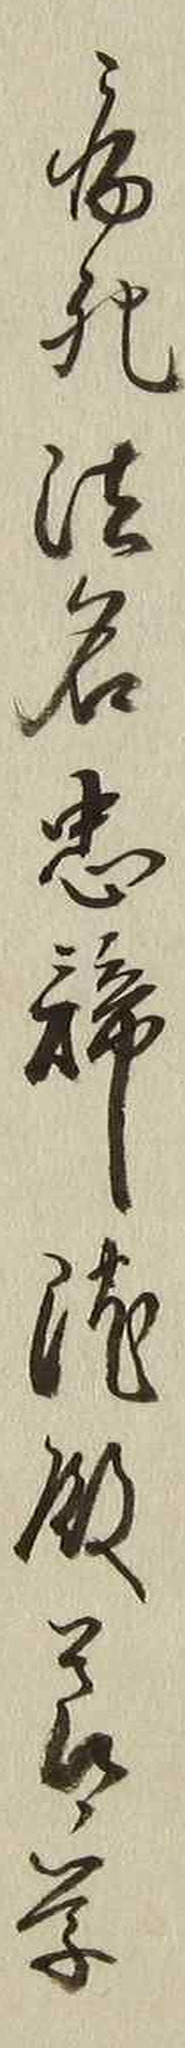病死法名忠禘院殿節学
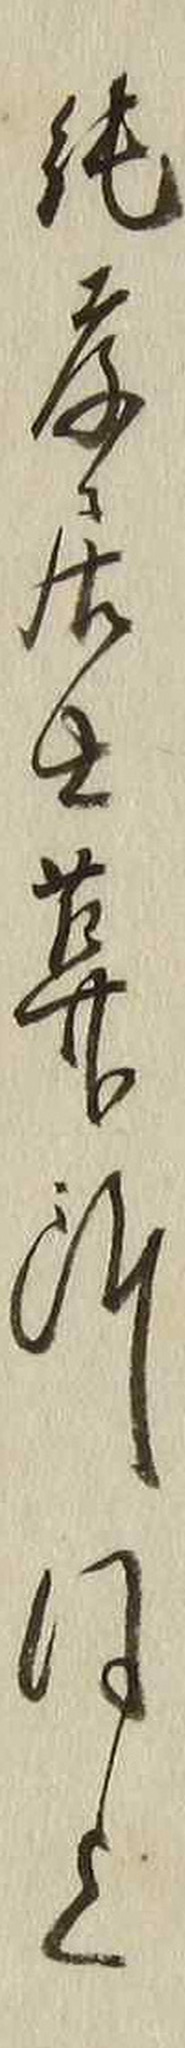純孝居士葬所同上
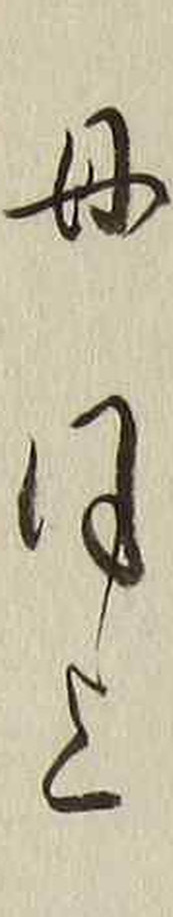母同上

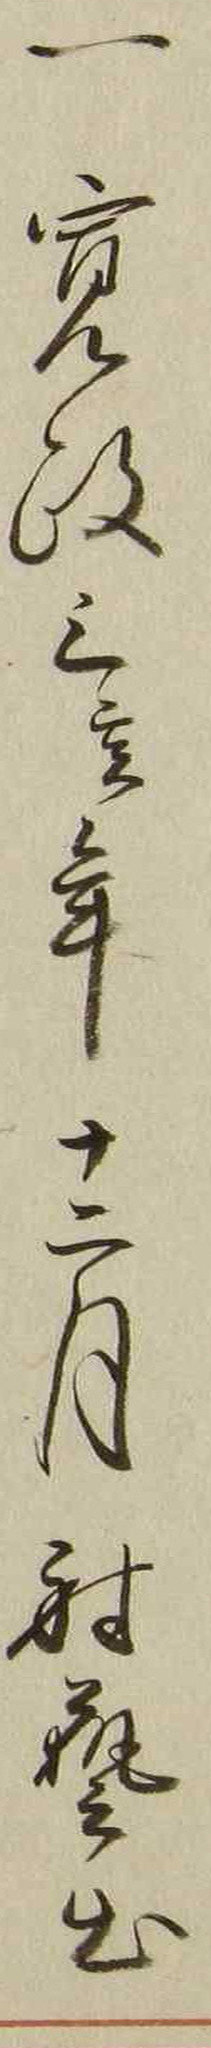一寛政三亥年十二月射芸出
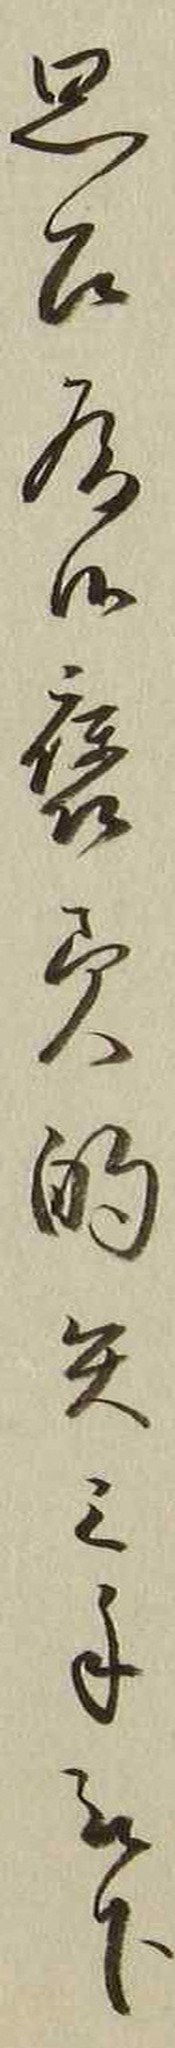思召為御褒美的矢三手被下
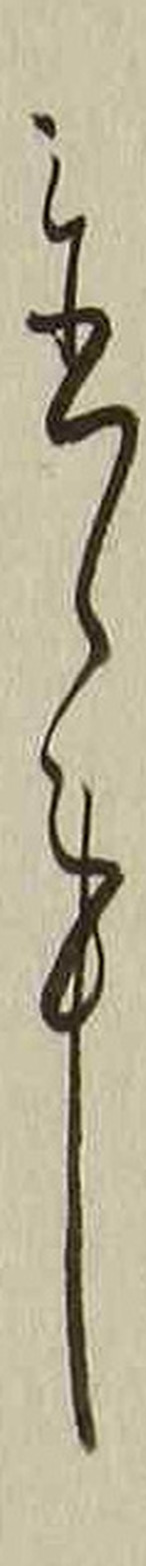置候事
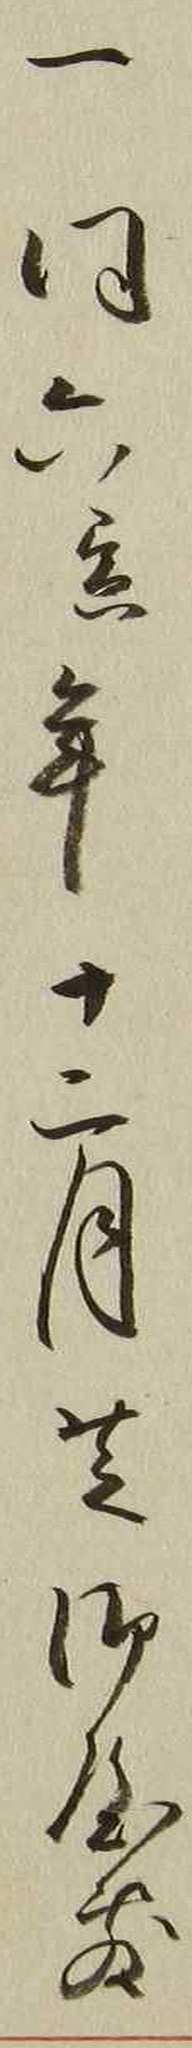一同六寅年十二月芝御屋敷
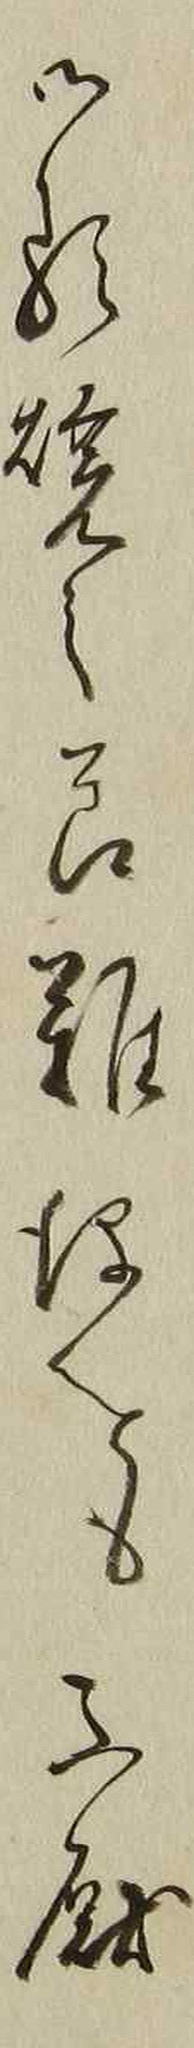御類焼之節難儀をも不厭
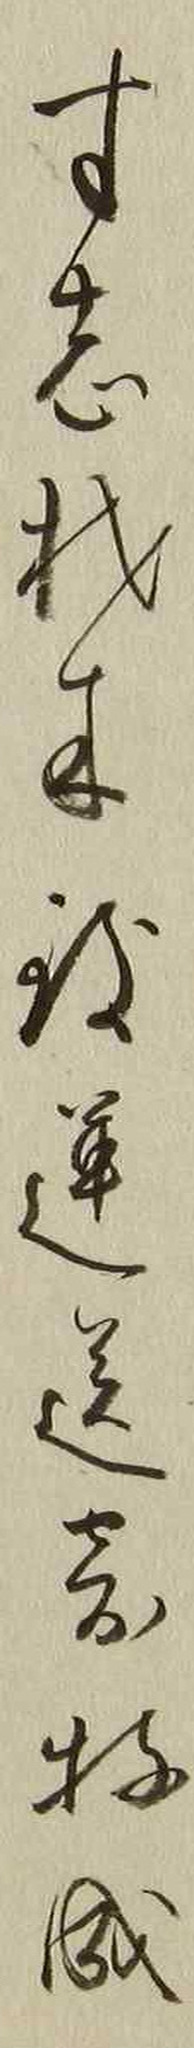寸志材木致運送奇特成
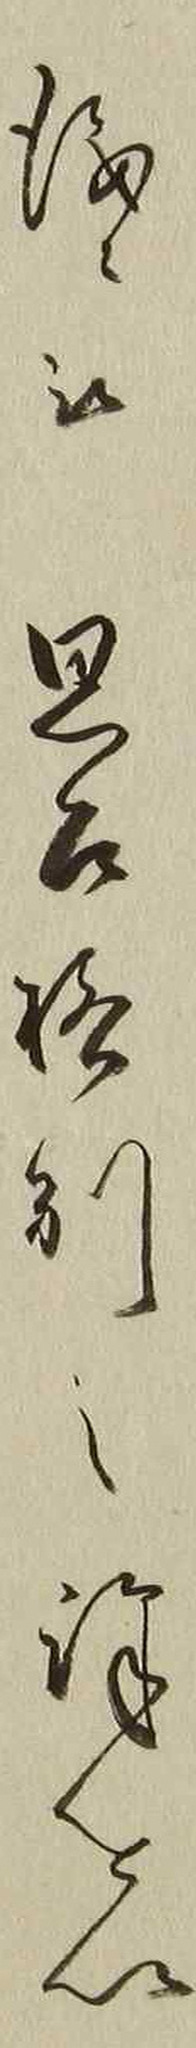儀に被思召格別之訳を以
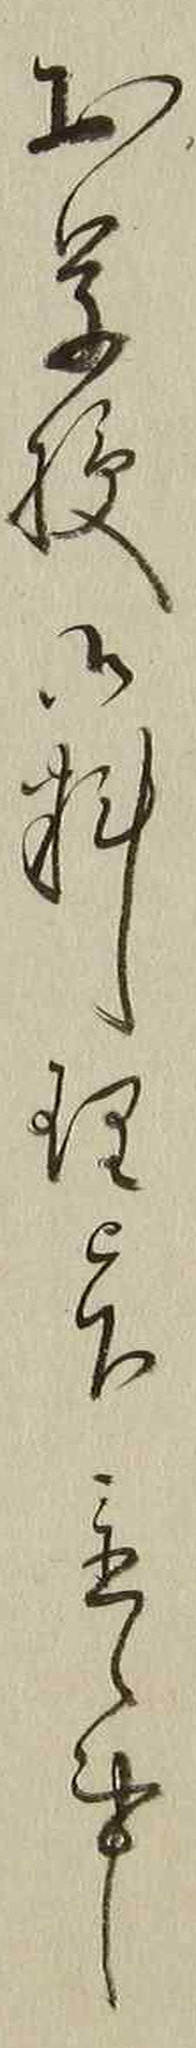於学校御料理被下置候事
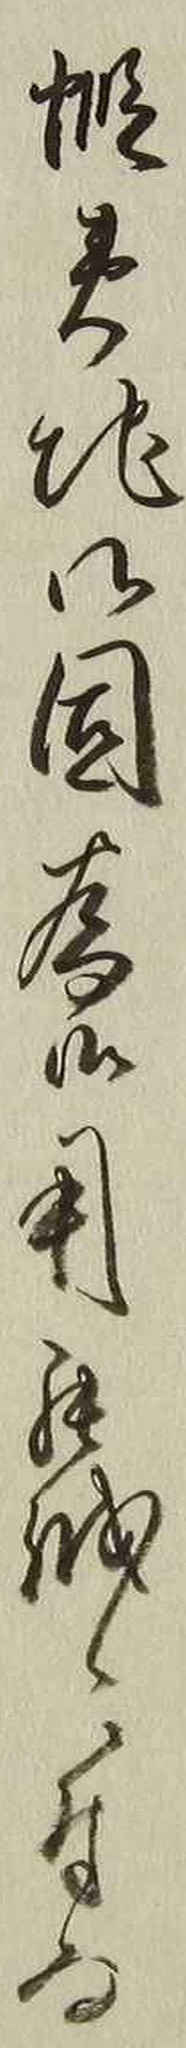蝦夷地御固為御用罷越候ニ付為
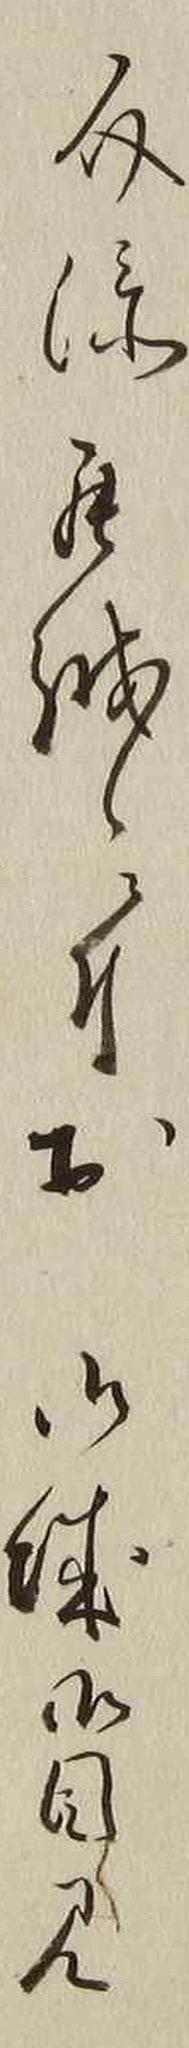介添罷越候ニ付於御城御目見
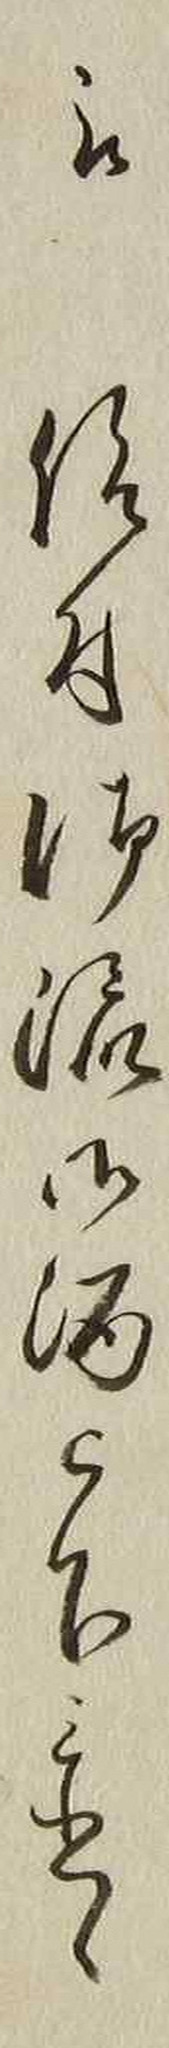被仰付御流御酒被下置候
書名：諸士系譜　巻之18　い之部18
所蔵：会津若松市立会津図書館
